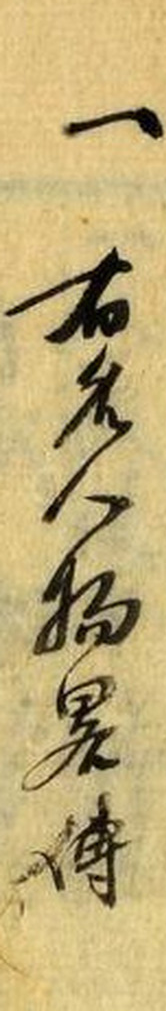一古名人物畧伝

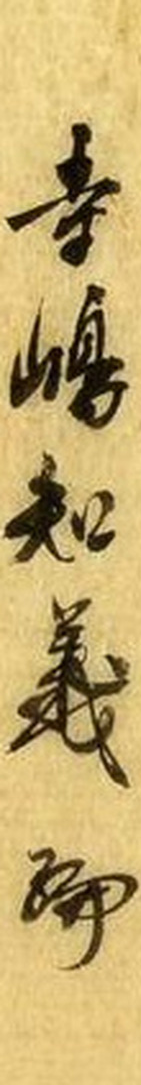寺嶋知義編
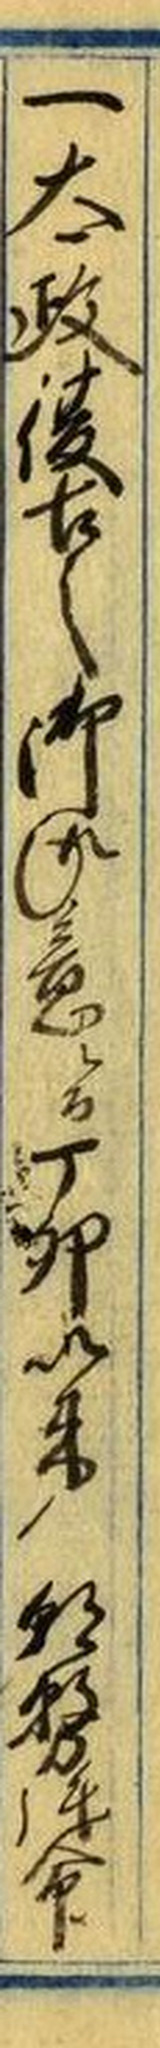一太政復古之御趣意ニ而丁卯以来朝務拝命
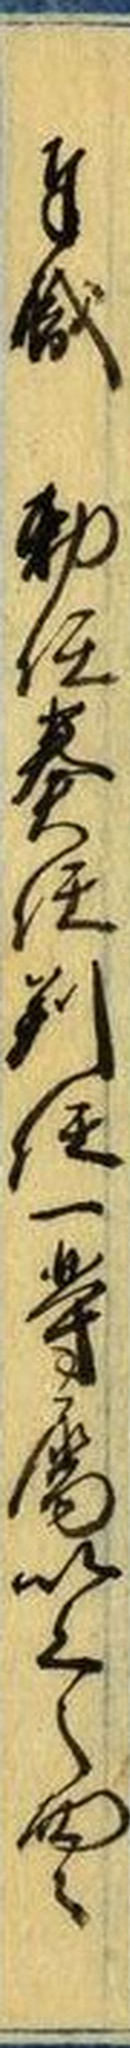奉職勅任奏任判任一等属以上之面々
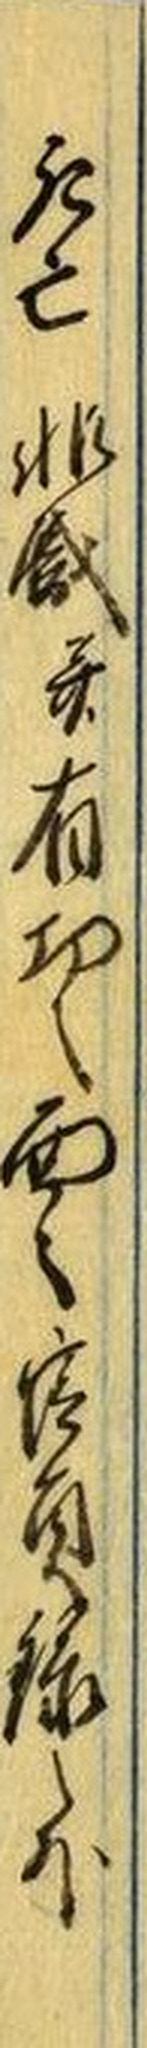死亡非職并有功之面々官員録之外
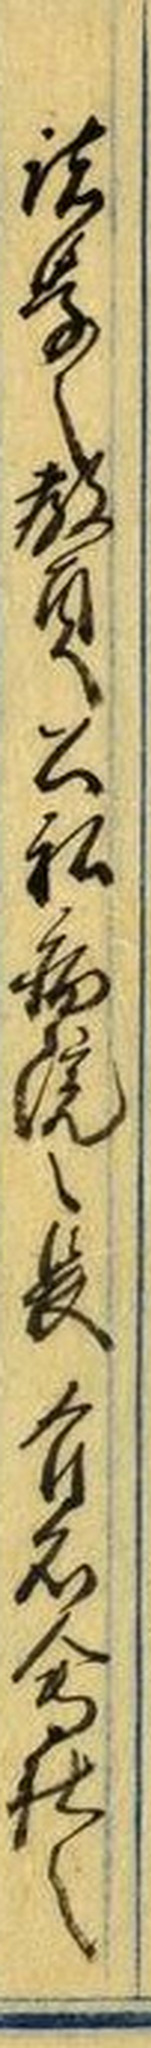諸学之教員へ公私病院之長有名会社之

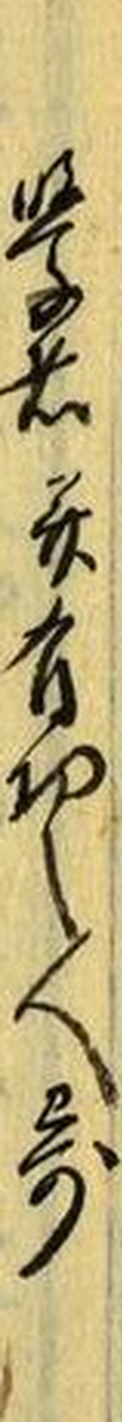学者并有功之人寄
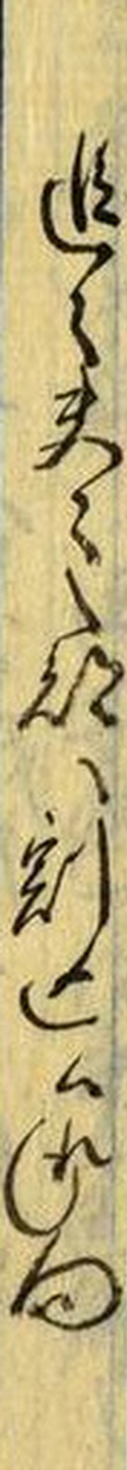追々夫々之部へ割込候趣向

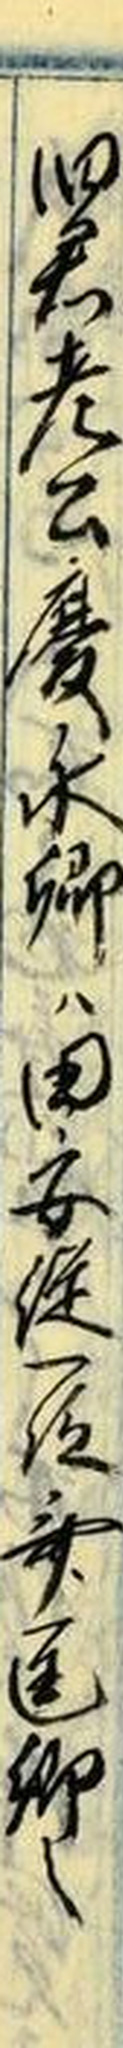旧君老公慶永卿ハ田安従一位斉匡卿之
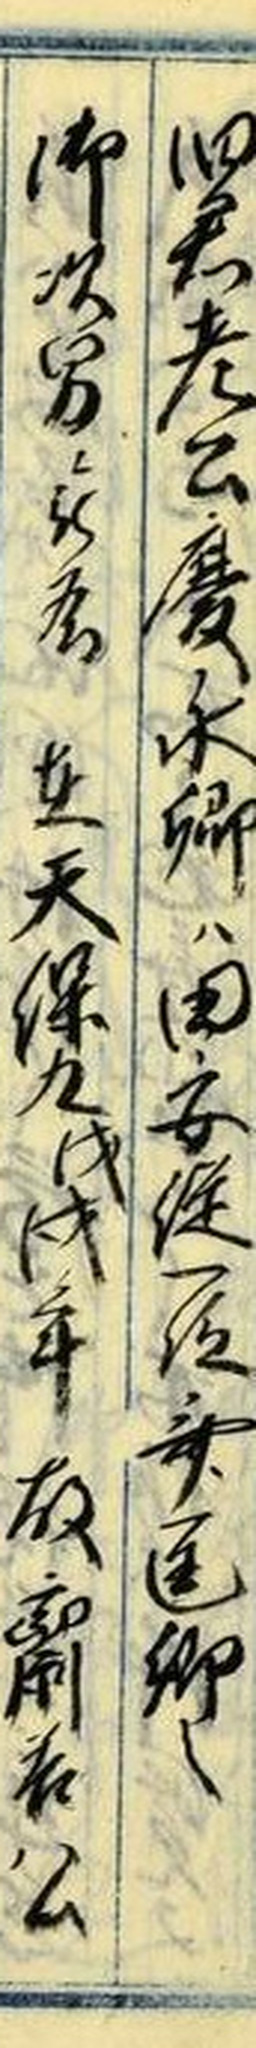御次男ニ被為在天保九戊戌年故斎善公
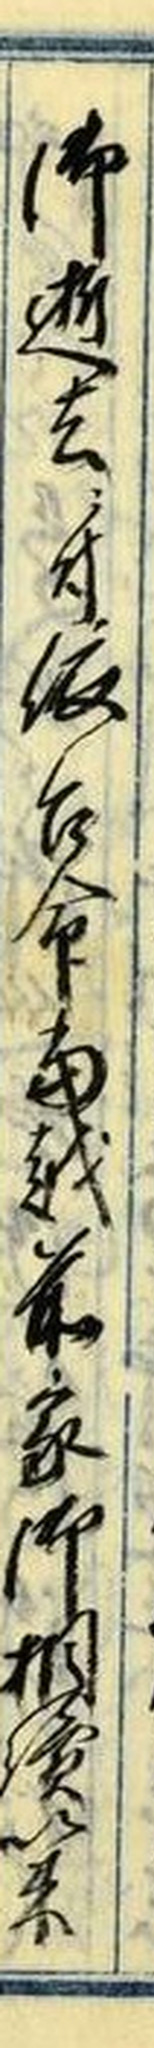御逝去ニ付依召命当越前家御相続以来
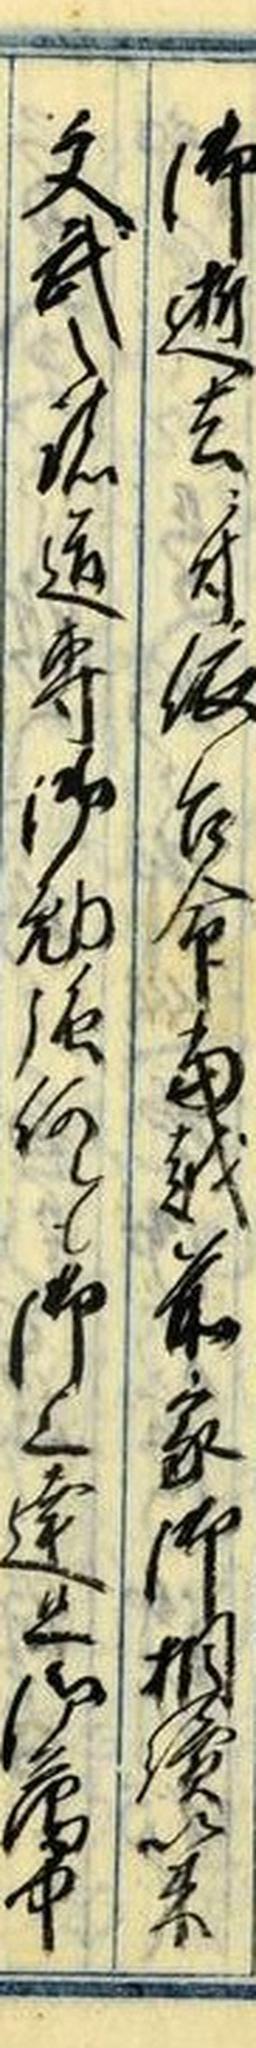文武之諸道専御勉強何レも御上達且御藩中
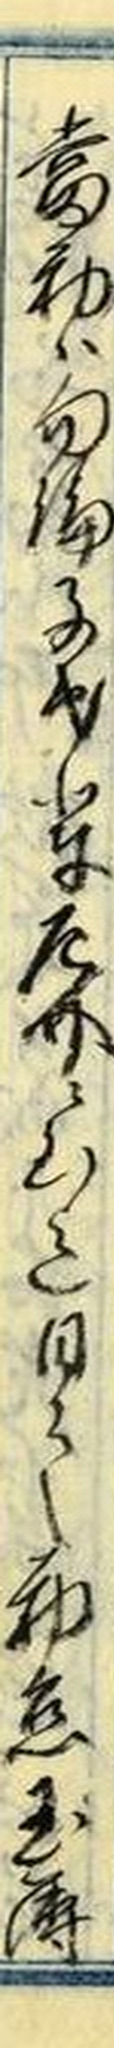当初ハ勿論子弟輩厄介ニ至迄日々之勤怠玉簿
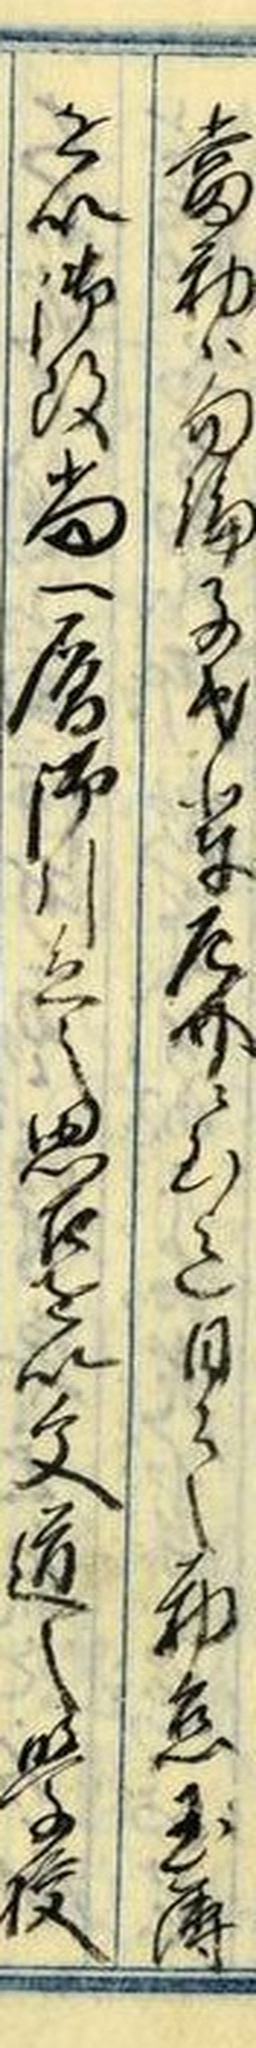を以御改尚一層御引立之思召を以文道之学校
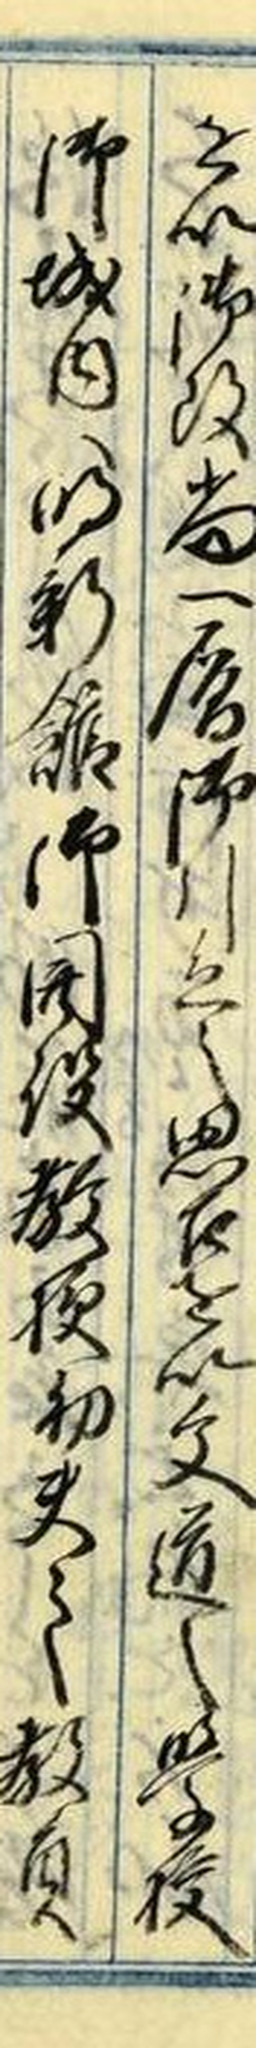御城内へ明新館御開役教授初夫々へ教員
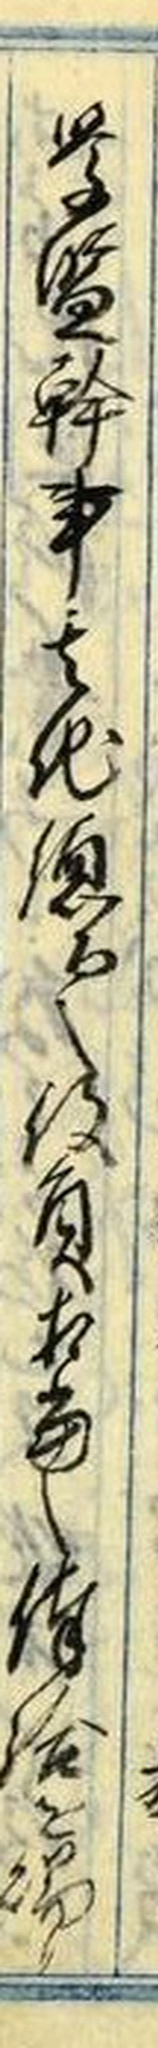学監幹事其他総而之役員相当之俸給を賜り
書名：温古集 三巻
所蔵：福井県文書館 Fukui Prefectural Archives
